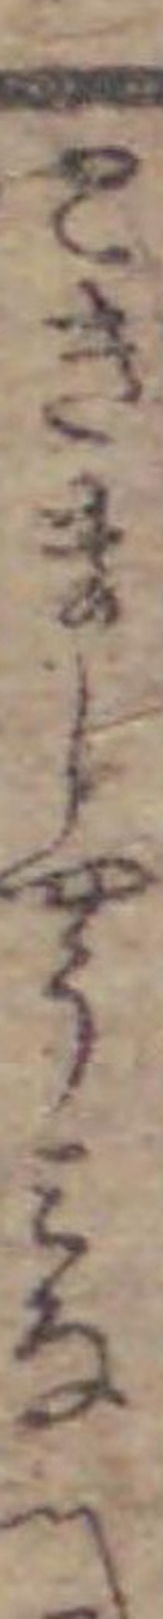ときましやうみな
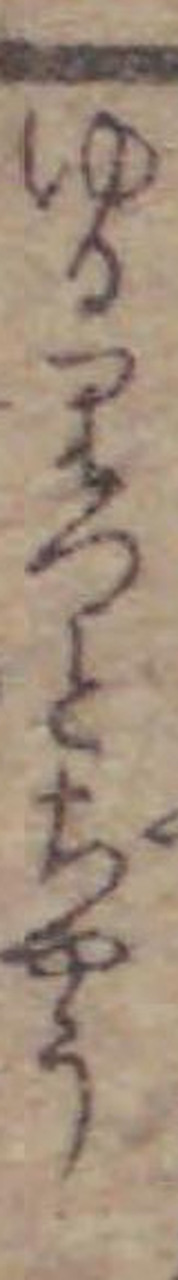ゆるりつとちやう
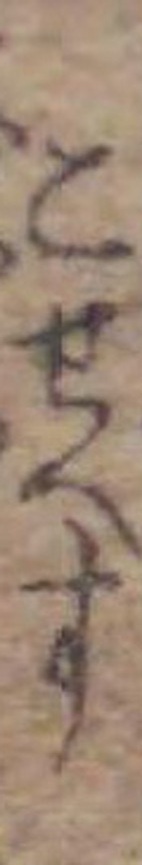ごせへす

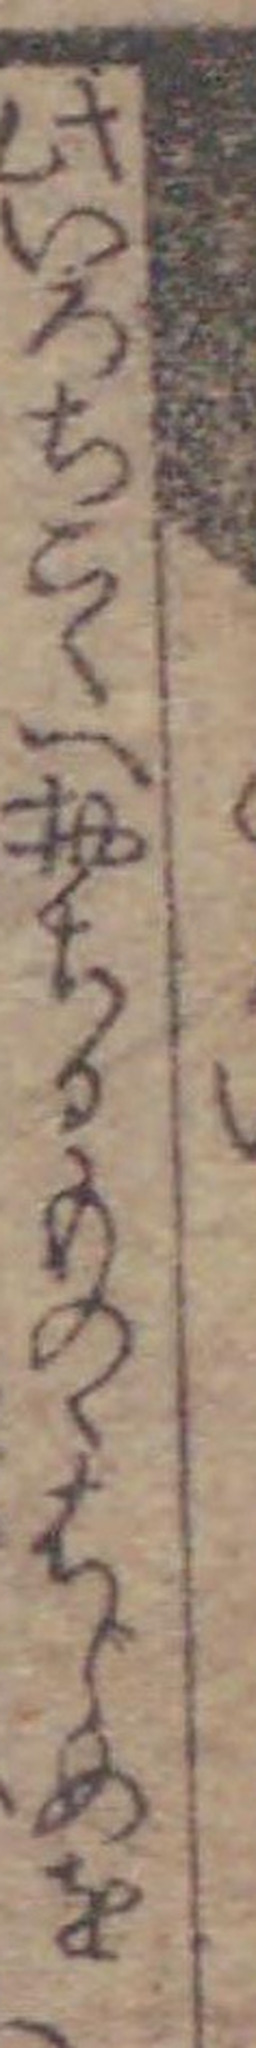此いろちこくへおちるものゝはじめを
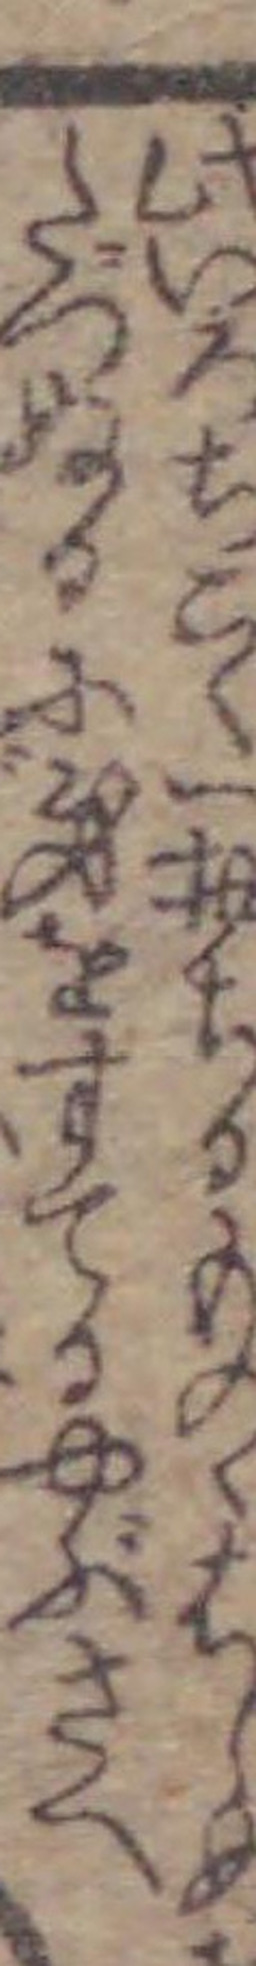たづぬるに身をすてるやぶさへ
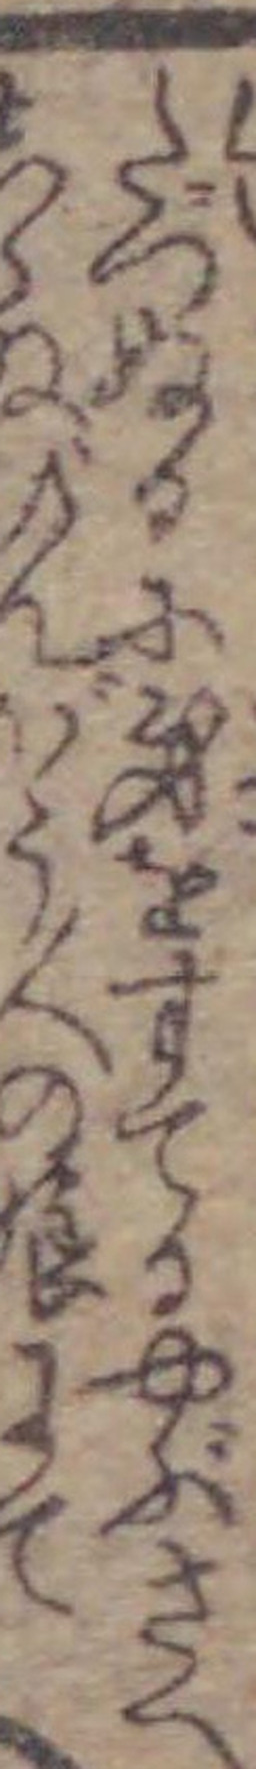しらぬびんぼう人の娘にて
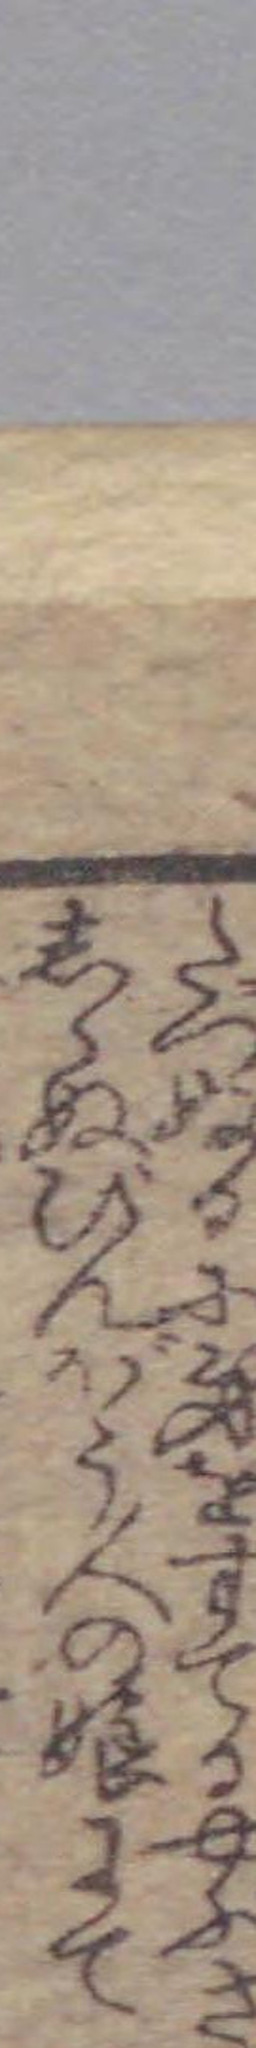しらぬびんぼう人の娘にて
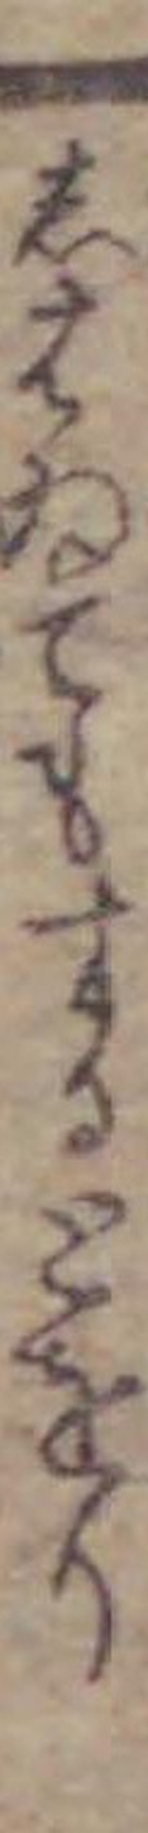しはゐてもするとをり
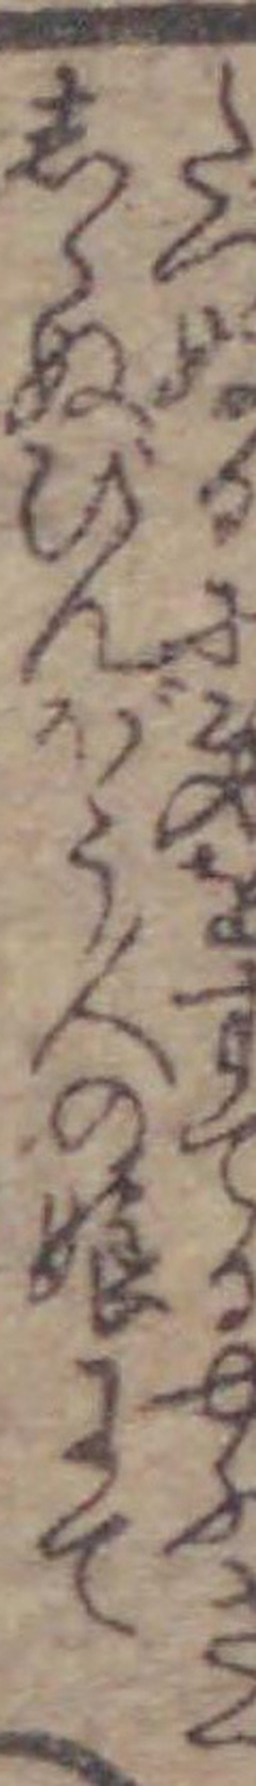しらぬびんぼう人の娘にて
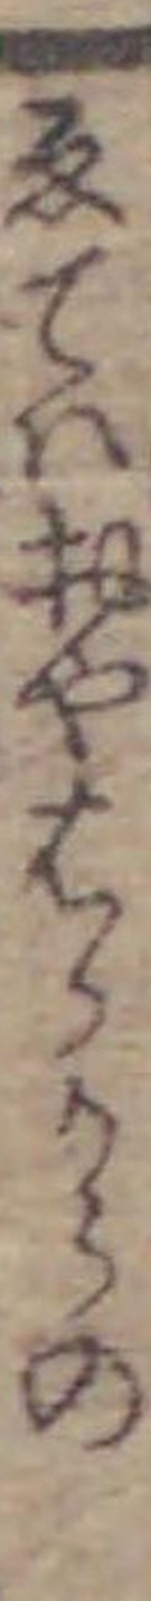ゑてはおやはらからの
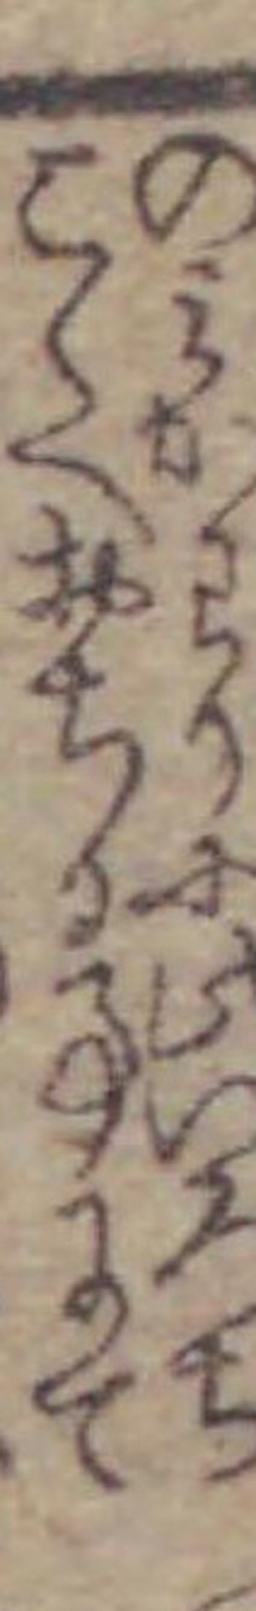こくへおちる事にて
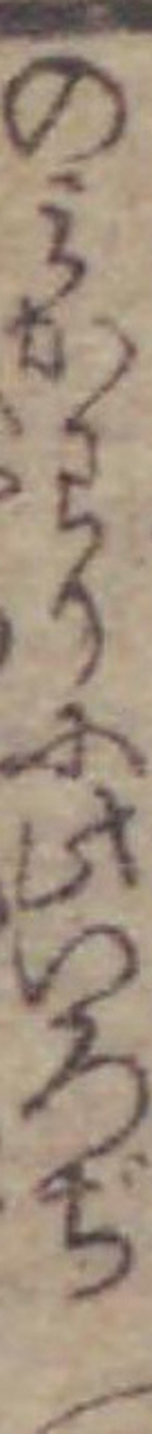のみかわりに此いろぢ
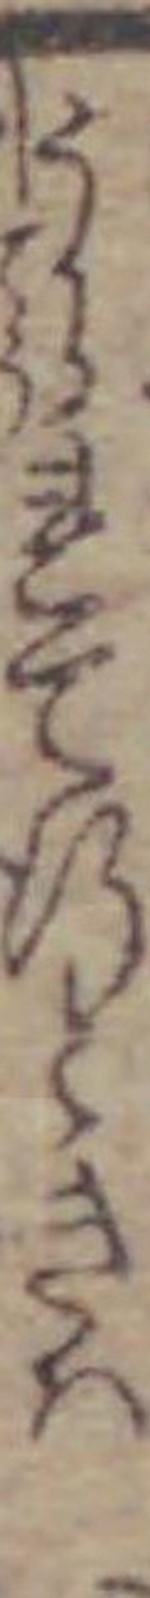うられて行ときは
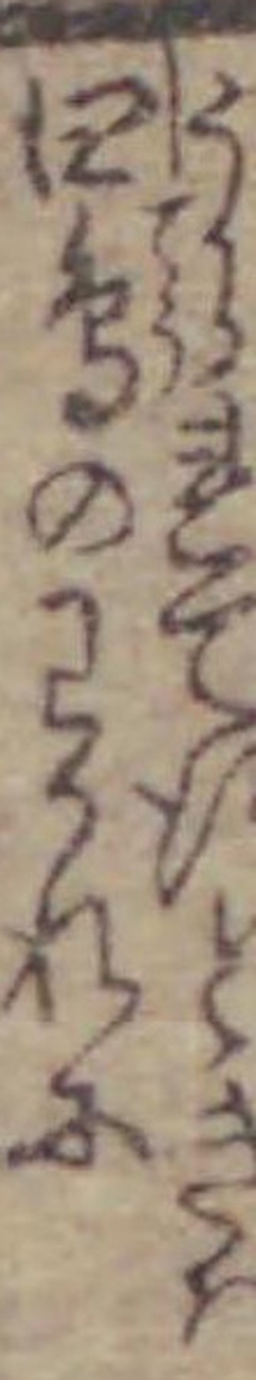四鳥のわかれに
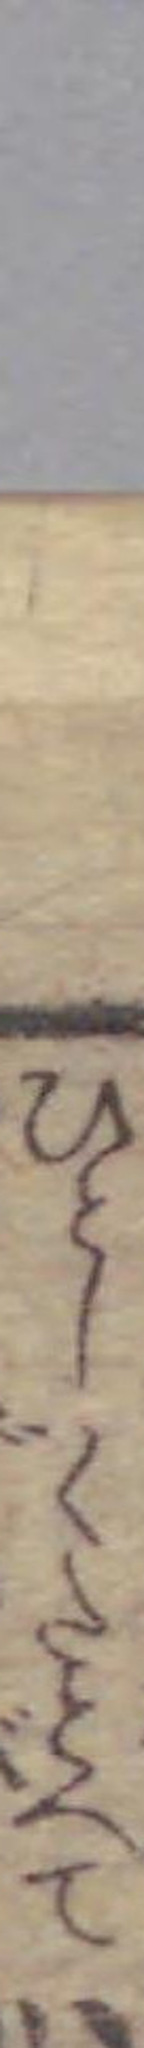ひとしくたとへて
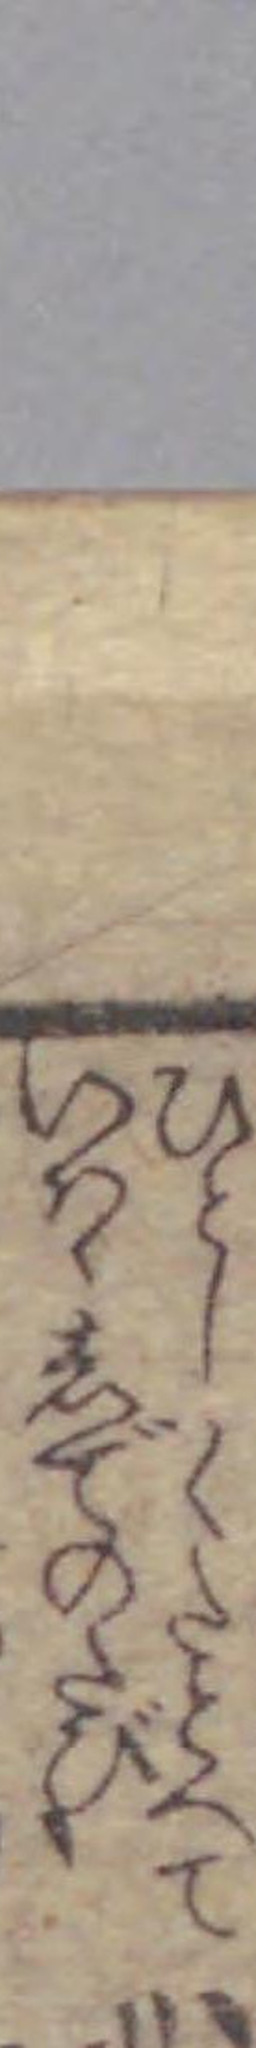いはゝしでのたび
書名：九替十年色地獄 : 3巻
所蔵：国立国会図書館 National Diet Library, JAPAN
